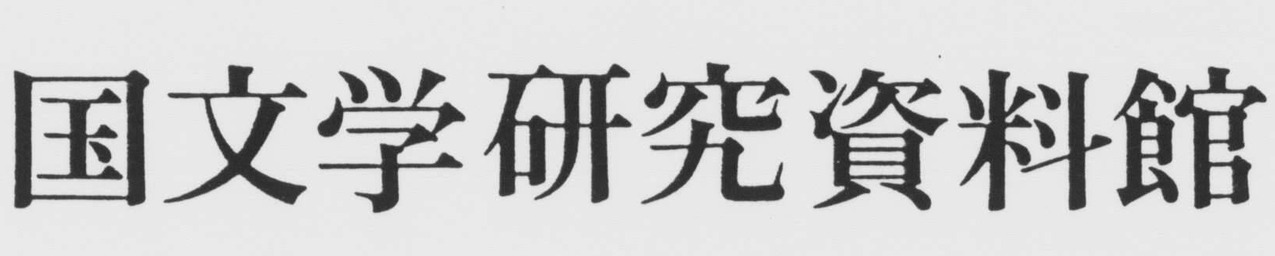国文学研究資料館
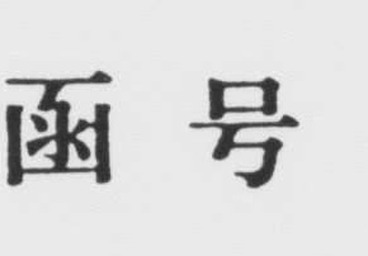函号.-.

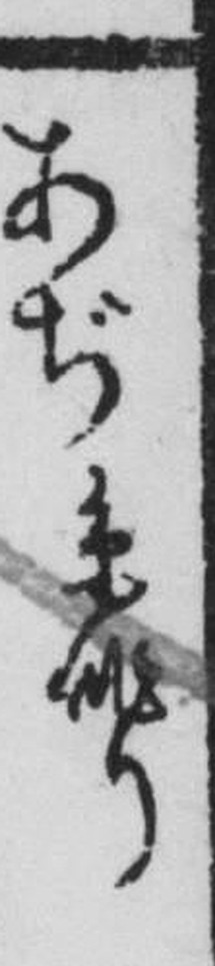あぢ糸作り
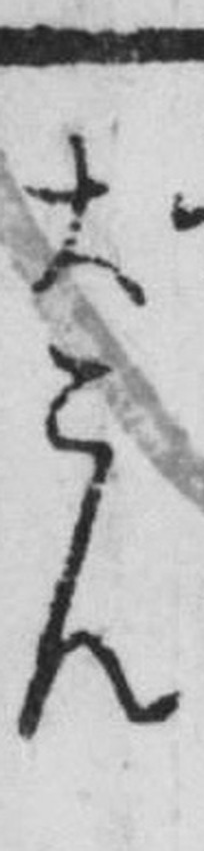大こん

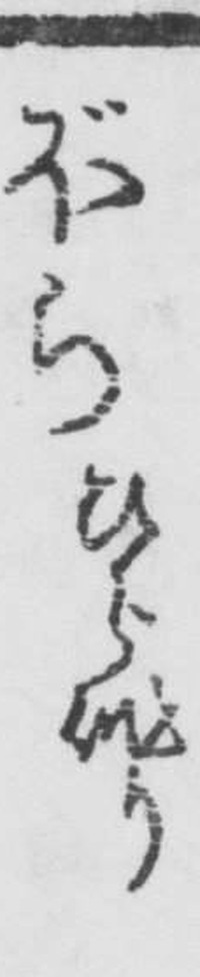ぼらひら作り
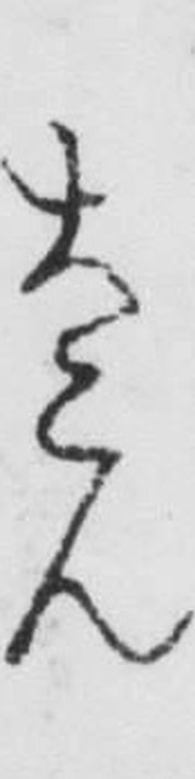大こん
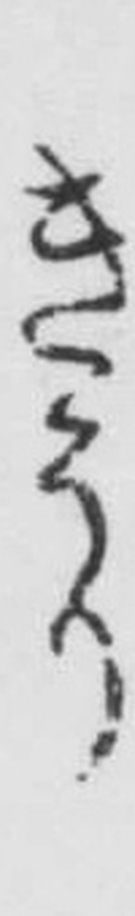きうり
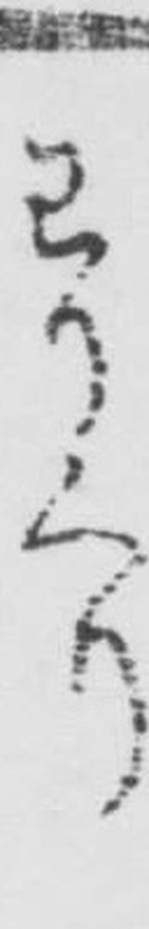わりくり
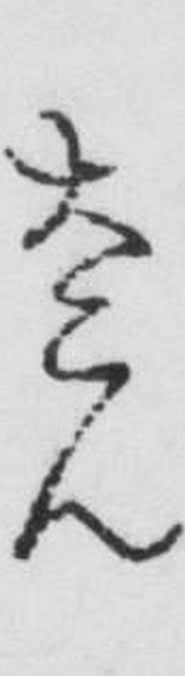大こん
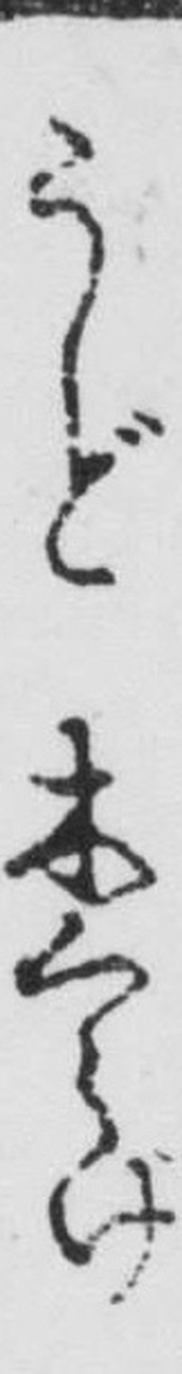うど木くらげ
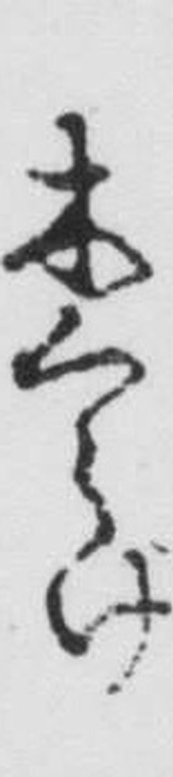木くらげ
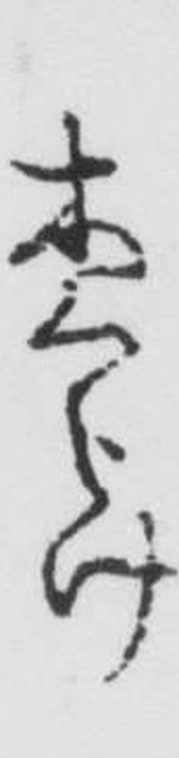木くらげ
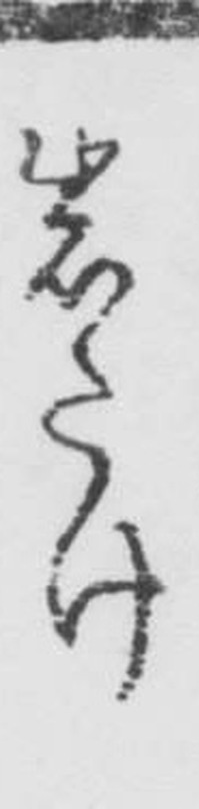岩たけ
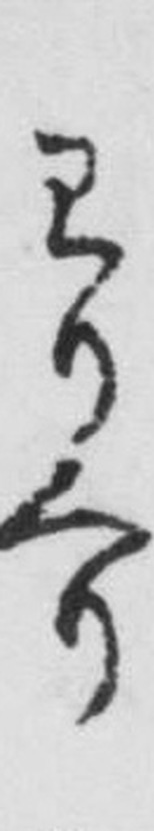わりくり
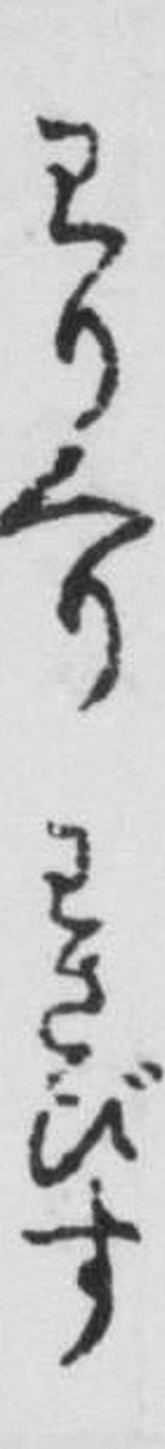わりくりわさびす
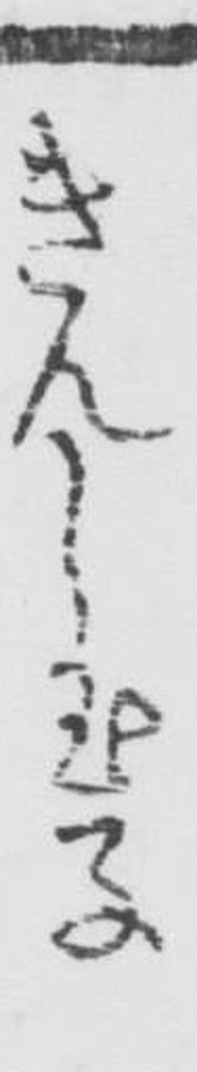きんし玉子
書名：諸家通用/即席料理
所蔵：大阪府立大学学術情報センター 国文学研究資料館
